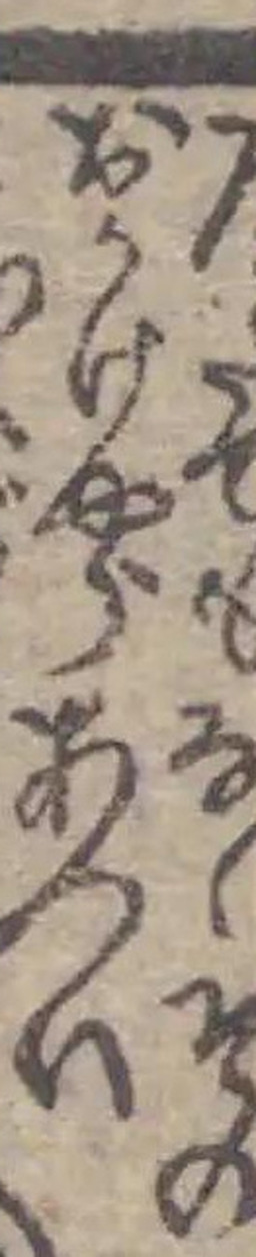おかけやらあつい
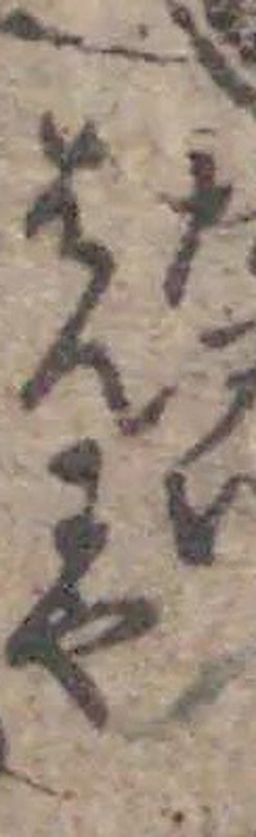はんにや
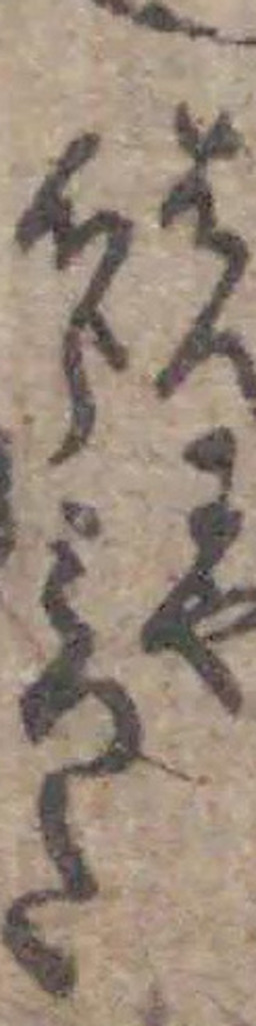はらみつた
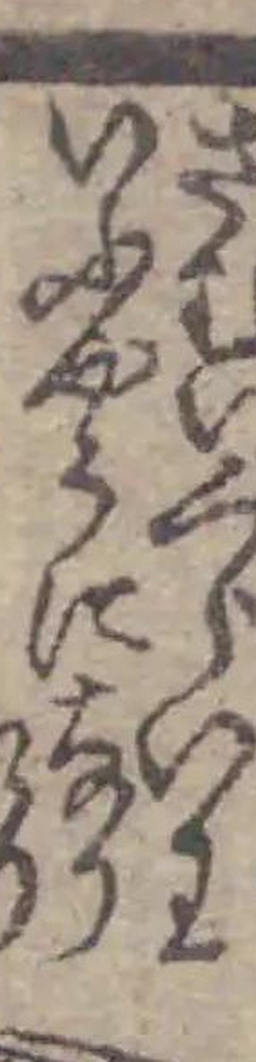いふやうになり

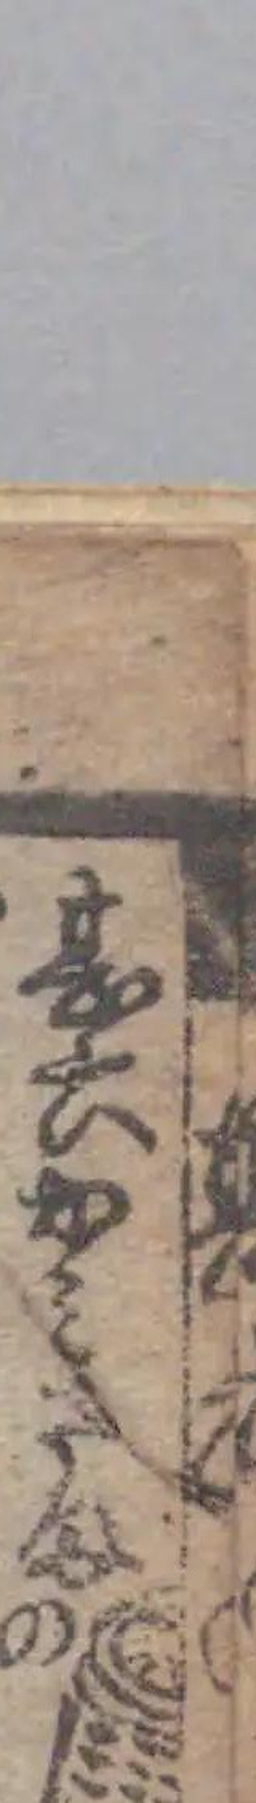甚六かみさまの
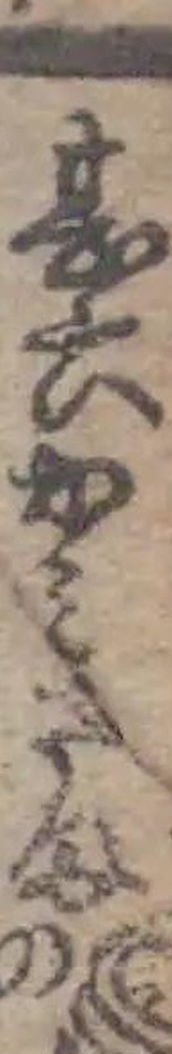甚六かみさまの
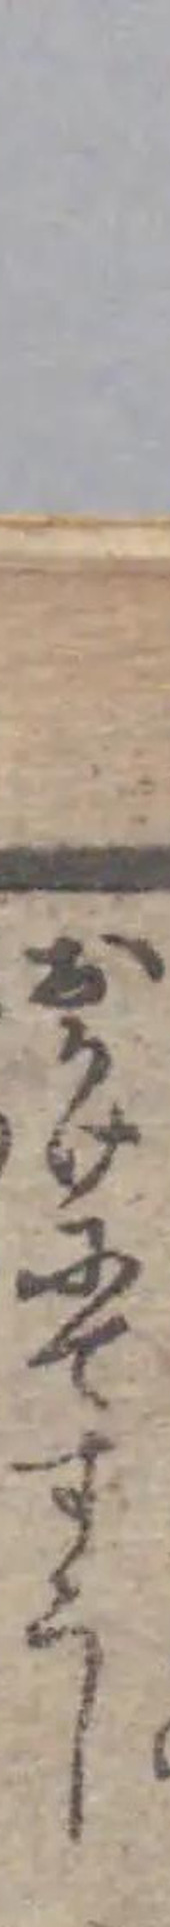おかけにてすこし
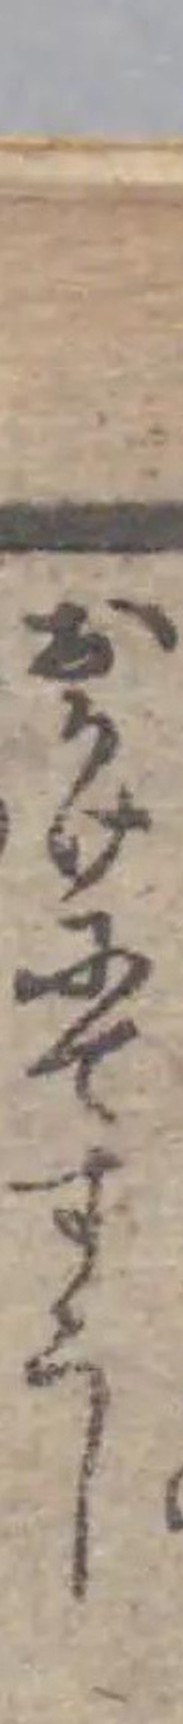おかけにてすこし
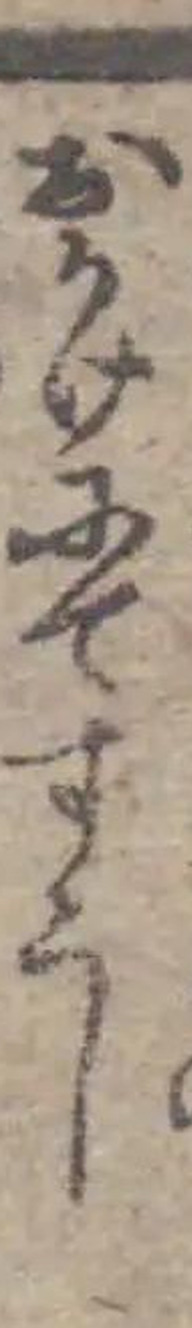おかけにてすこし
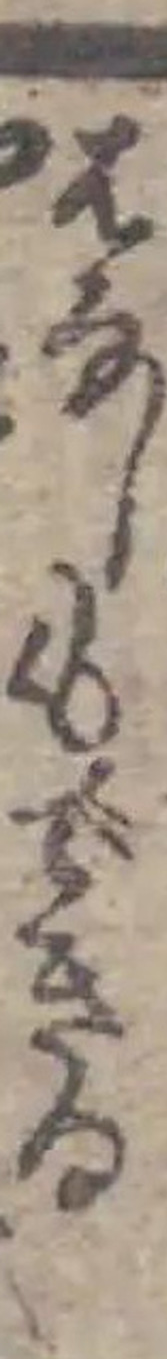はなしもできる
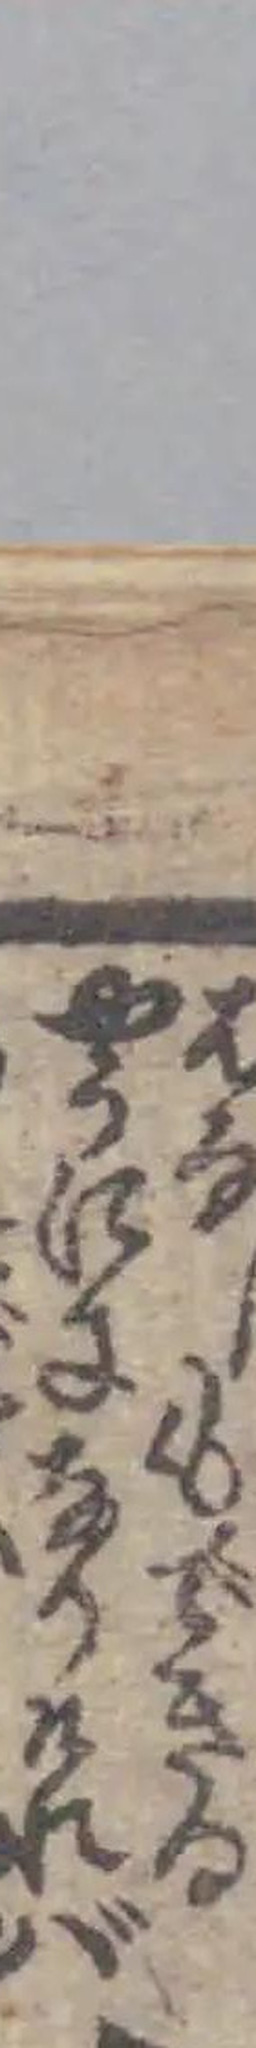やうにになりければ
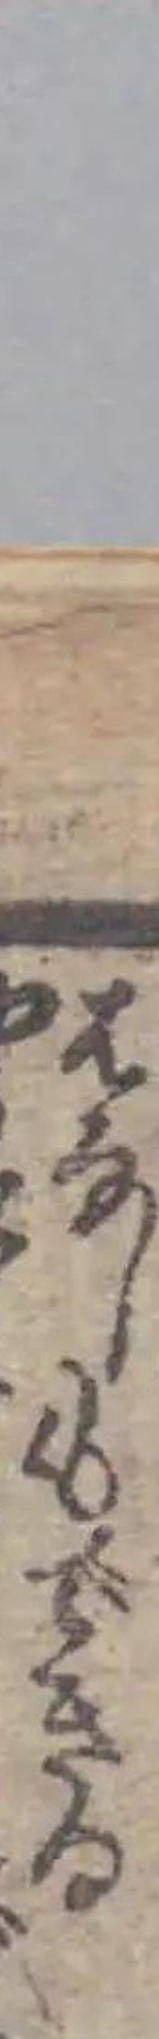はなしもできる
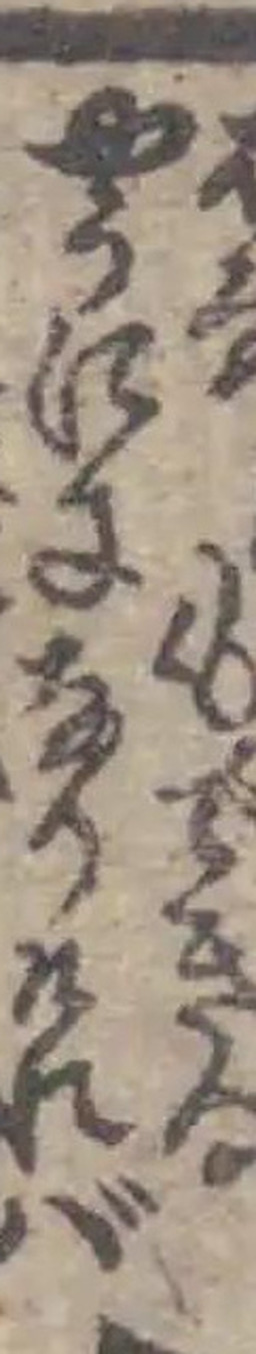やうにになりければ
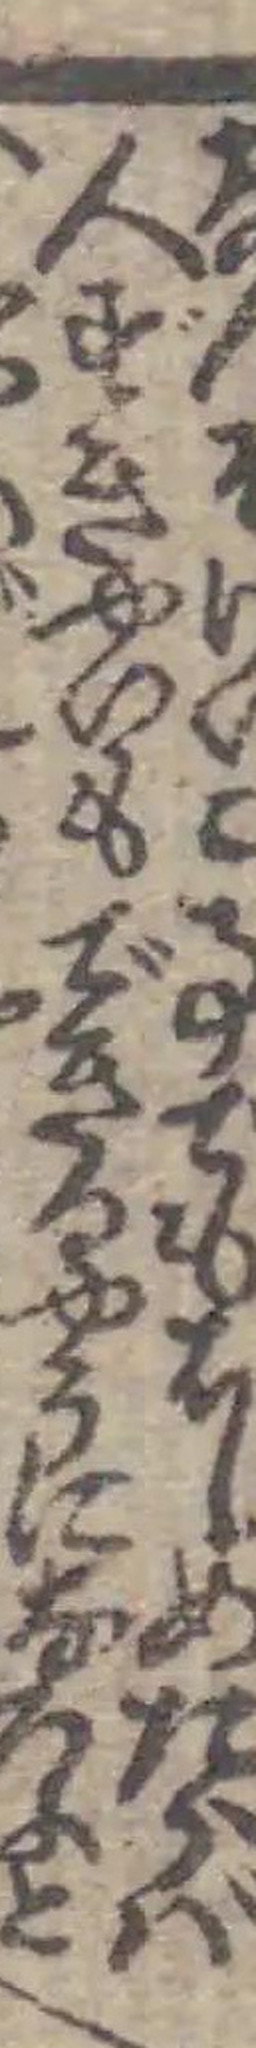人ずきやいもできるやうになろふと
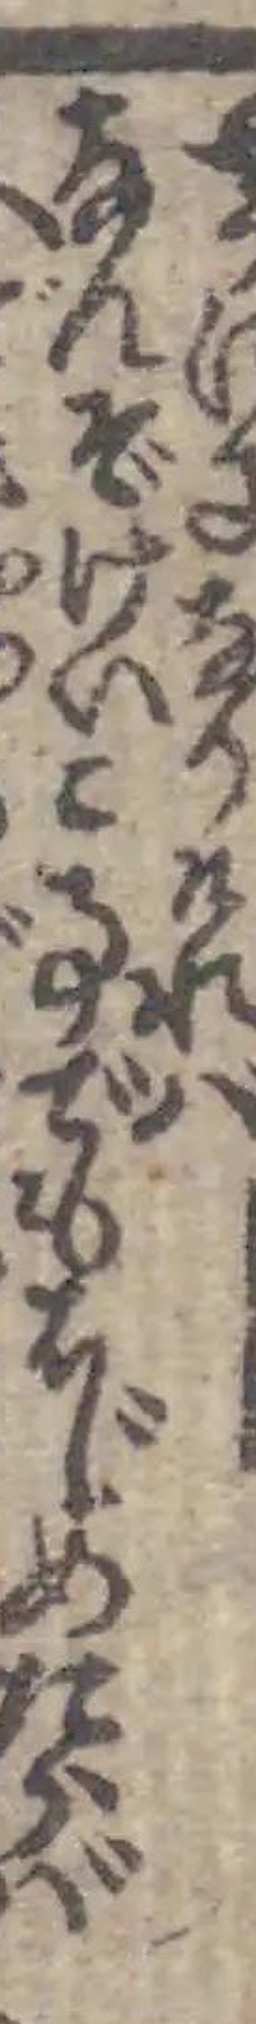なんぞけいこごとでもはじめたらば
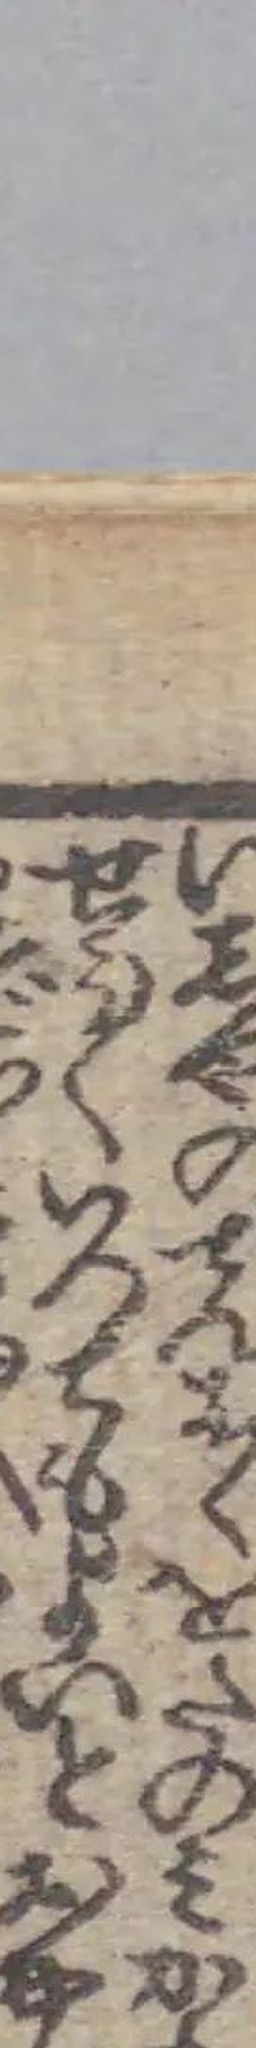せう〳〵いつてもよいとおやじ
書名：津以曽無弟の甚六 3巻
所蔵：国立国会図書館 National Diet Library, JAPAN
